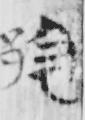陰
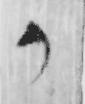人
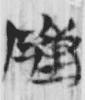○（陳）
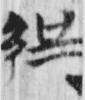強
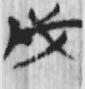戊
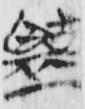○（盬）
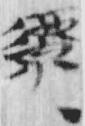虩
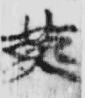黃
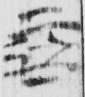亞
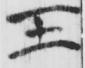壬
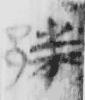邾
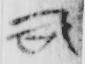司
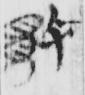敗
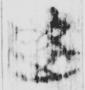阩
